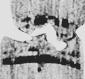三
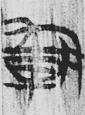軍
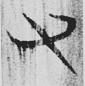又（有）
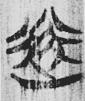○（帥）
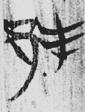邦
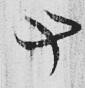又
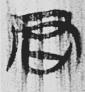君
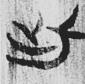此
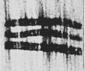三
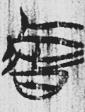者
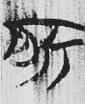所
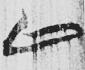㠯
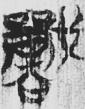○（戰）
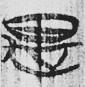是
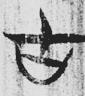古（故）
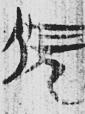倀（長）
